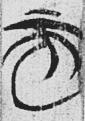而
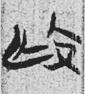○（撫）
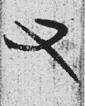又（有）
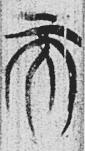天
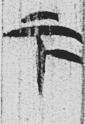下
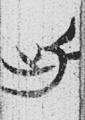此
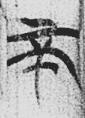不
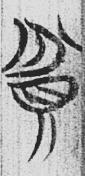貧
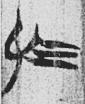於
